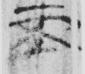不
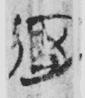{辶取}（趨）
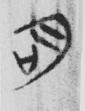名
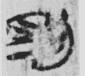則
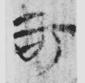可
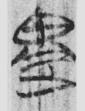{畏止}（畏）
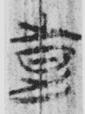{止田止}（實）
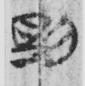則
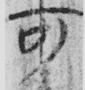可
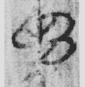{矛人}（侮）
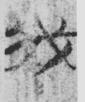我
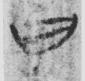曰
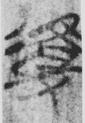○（且）
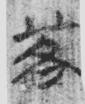茖
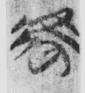○（乎）
